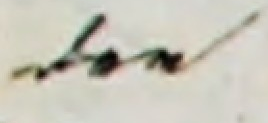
der
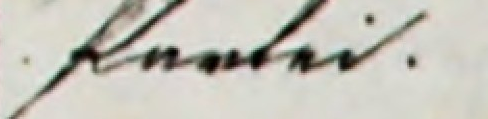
Partei.
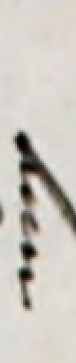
ung
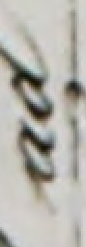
ad
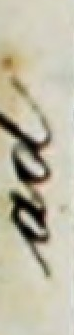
ad
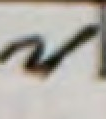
J
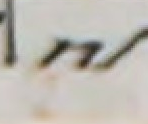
K
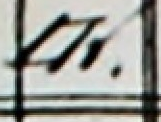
K.
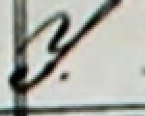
J.
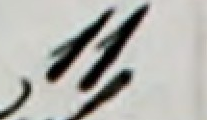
11
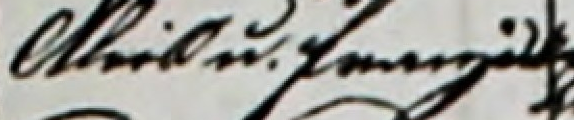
Alois u. Franziska
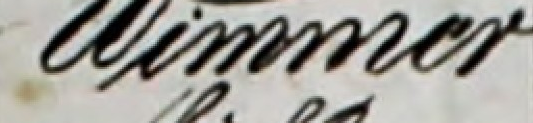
Wimmer
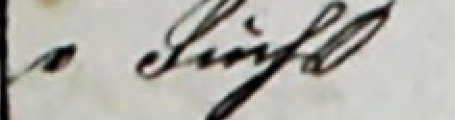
v. Fuchs
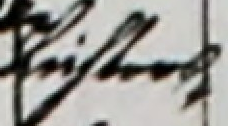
Lichters„
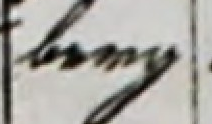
berg
